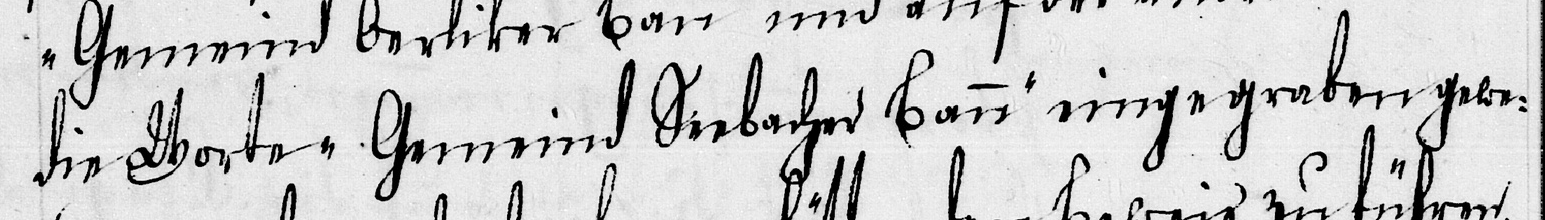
die Worte „Gemeind Seebacher Bann“ eingegraben gewe¬
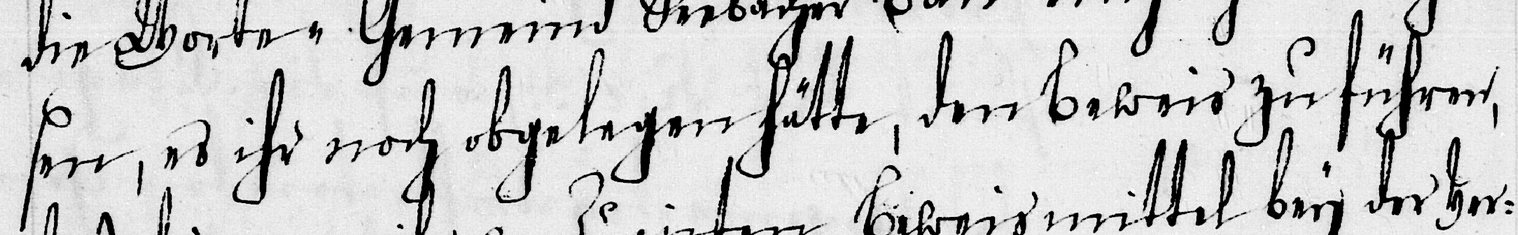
sen, es ihr noch obgelegen hätte, den Beweis zu führen,
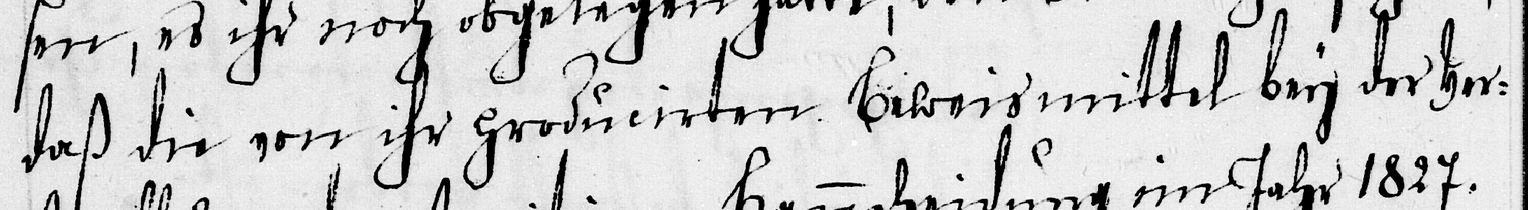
daß die von ihr producirten Beweismittel bey der Ver¬
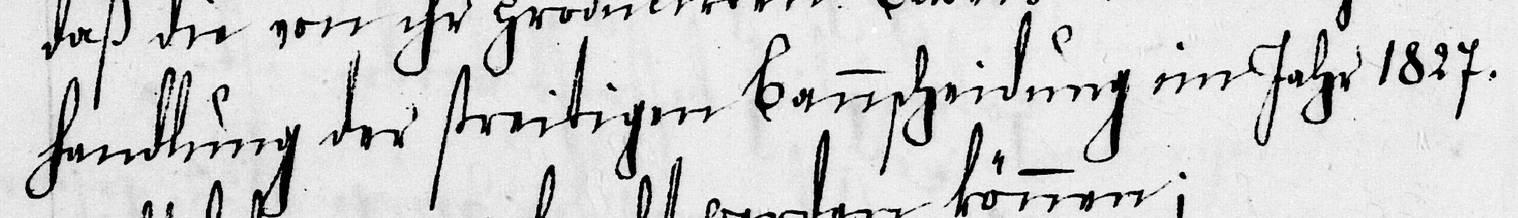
handlung der streitigen Bannscheidung im Jahr 1827.
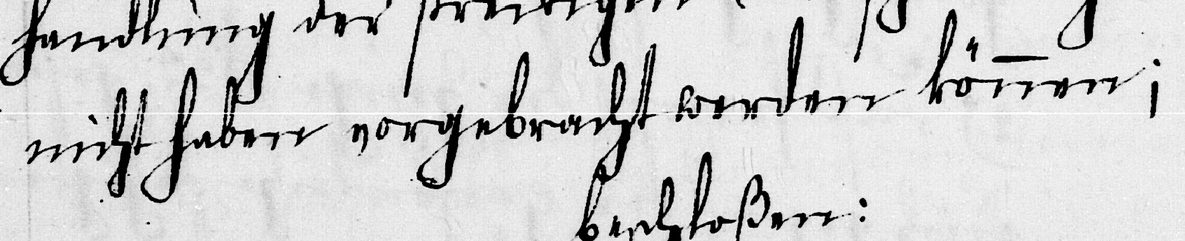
nicht haben vorgebracht werden können;
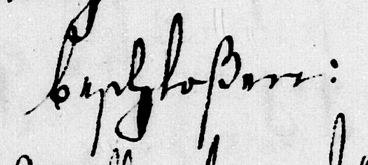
beschloßen:
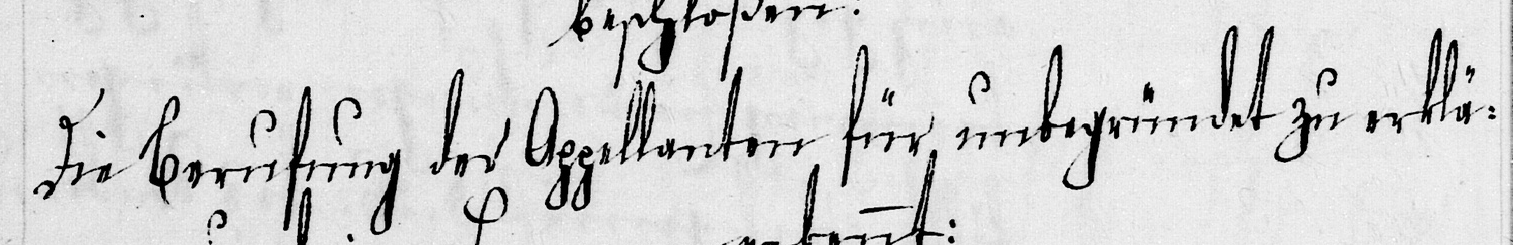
Die Berufung der Appellanten für unbegründet zu erk¬
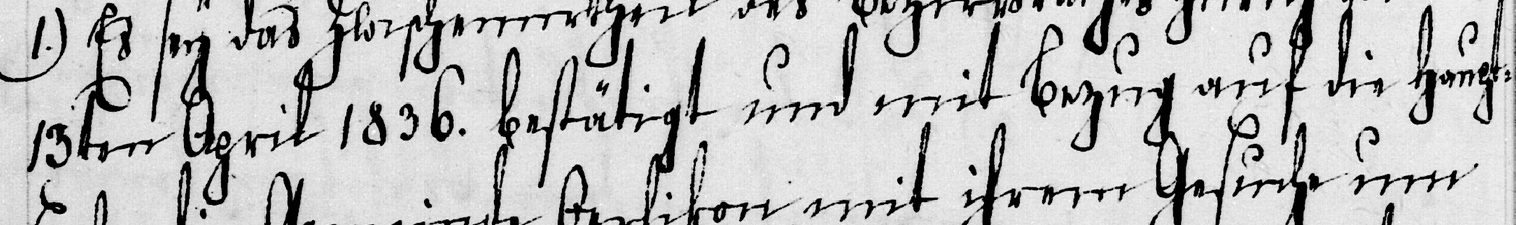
13ten April 1836. bestätigt und mit Bezug auf die Haupt¬
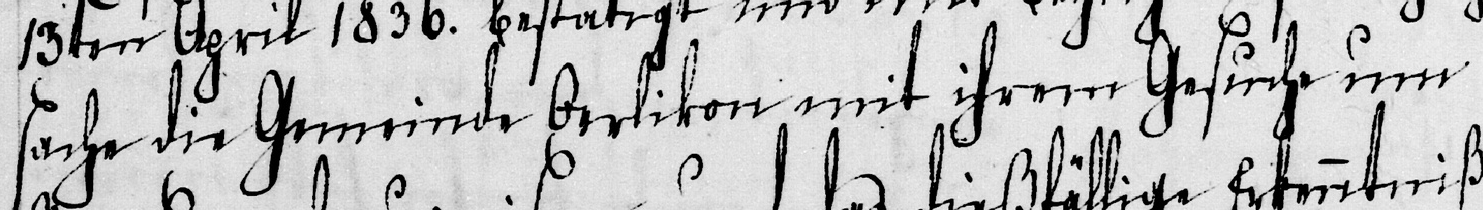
sache die Gemeinde Oerlikon mit ihrem Gesuche um
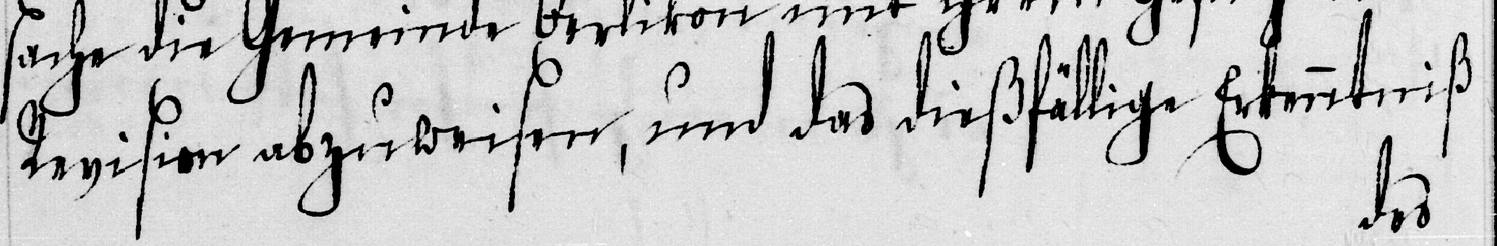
Revision abzuweisen, und das dießfällige Erkenntniß
